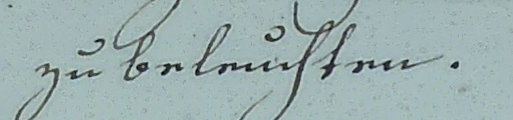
zu beleuchten.
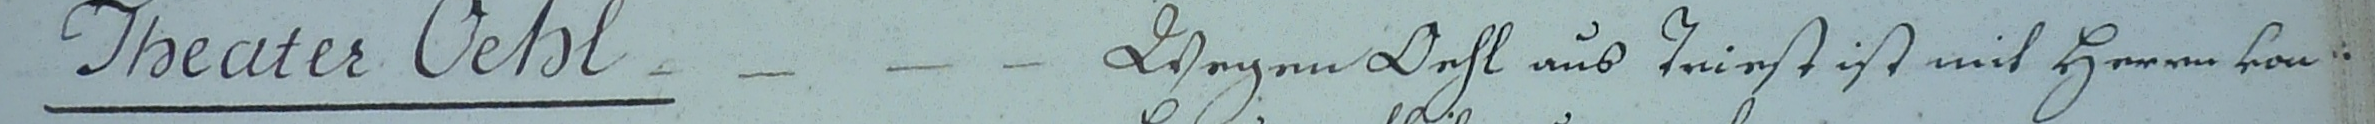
Theater Oehl _ _ _ _ Wegen Oehl ausTriest ist mit Herrn von
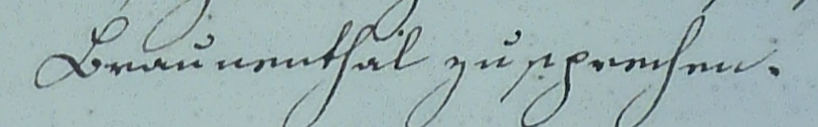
Braunerthal zu sprechen.
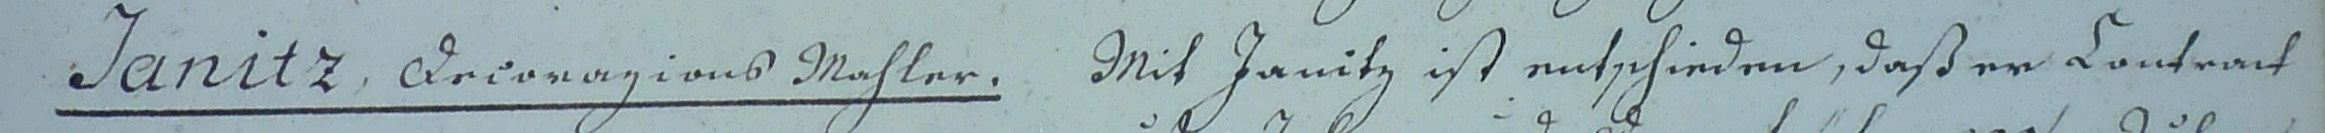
Janitz, Decorazions Mahler. Mit Janitz ist entschieden, daß er Contract
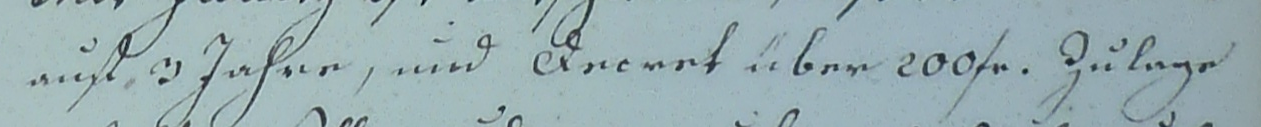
auf 3 Jahre, und Decret über 200fr. Zulage
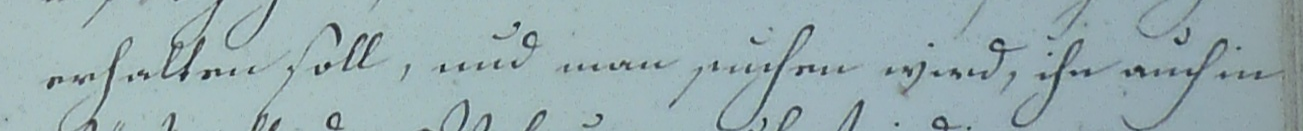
erhalten soll, und man suchen wird, ihn auch in
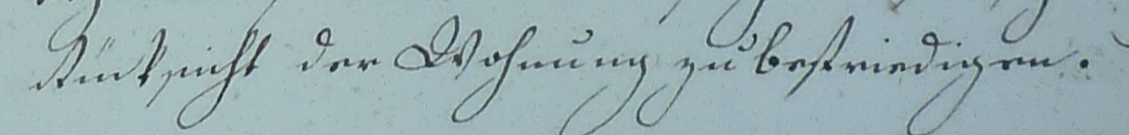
Rücksicht der Wohnung zu befriedigen.
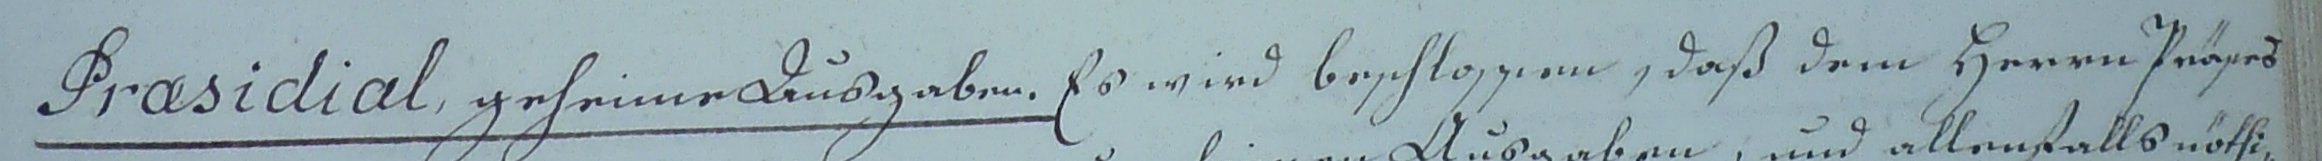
Præsidial, geheime Ausgaben. Es wird beschlossen, daß dem Herrn Präses
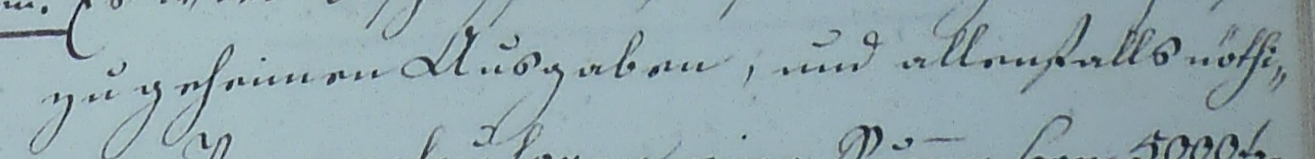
zu geheimen Ausgaben, und allenfalls nöthi¬
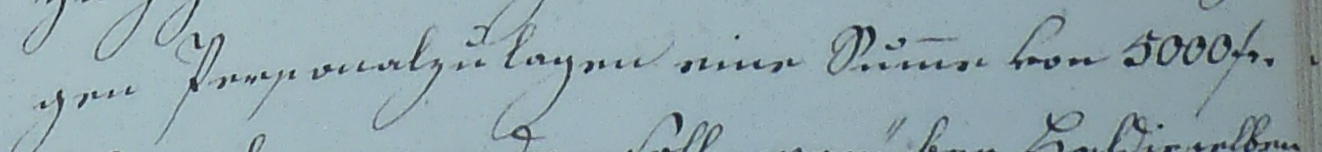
gen Personalzulagen eine Summe von 5000fr.
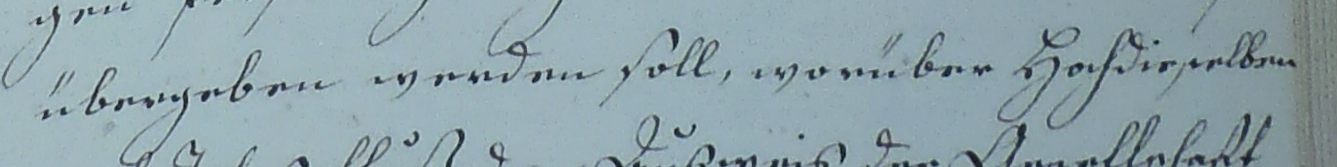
übergeben werden soll, worüber Hochdieselben
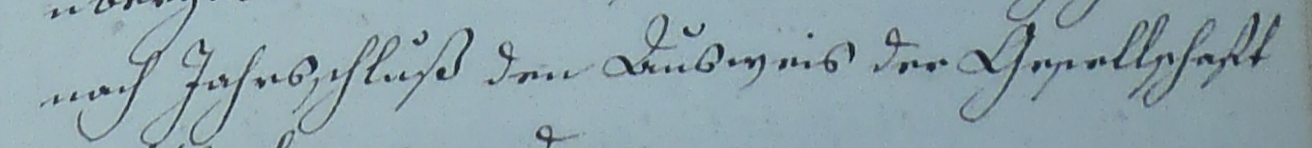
nach Jahresschluß den Ausweis der Gesellschaft
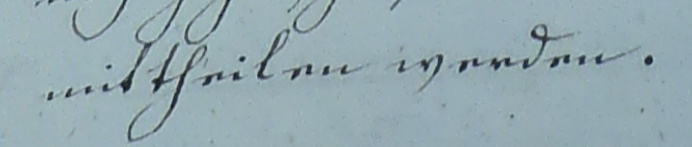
mittheilen werden.
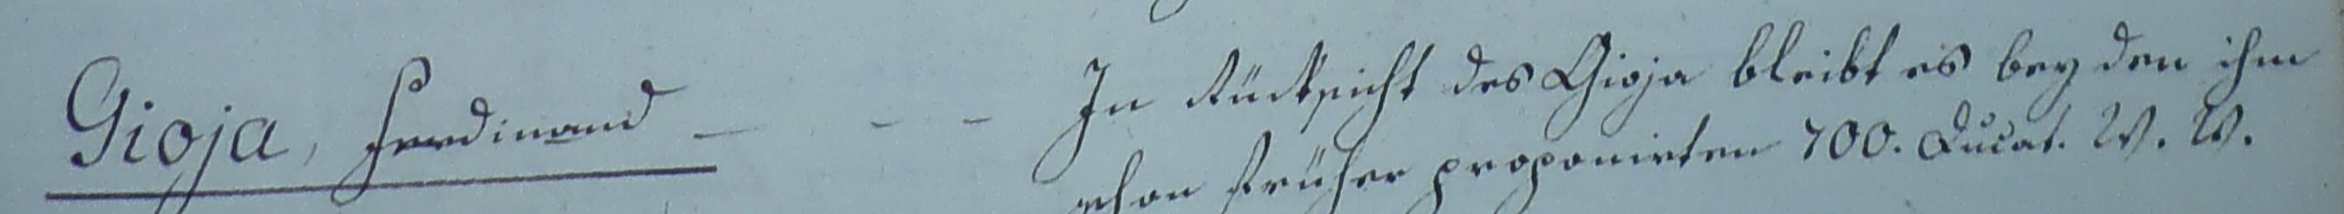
Gioja, Ferdinand _ _ _ In Rücksicht des Gioja bleibt es bey den ihm
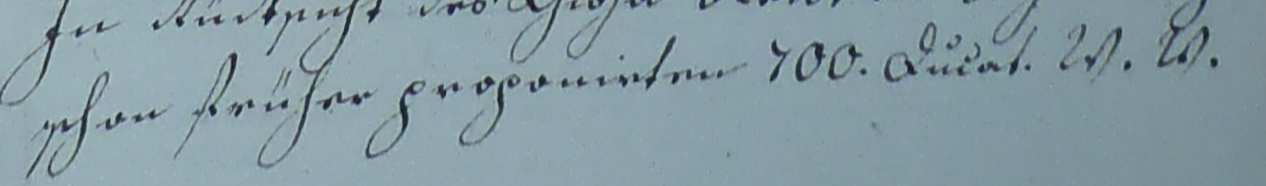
schon früher proponirten 700. Ducat. W.W.
